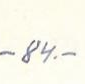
64
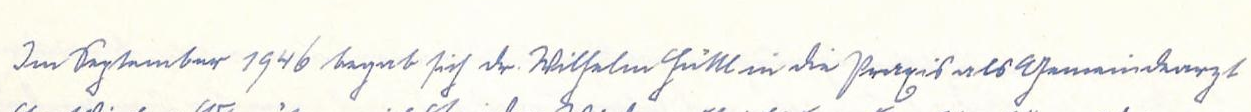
Im September 1946 begab sich Dr. Wilhelm Hüttl in die Praxis als Gemeindearzt
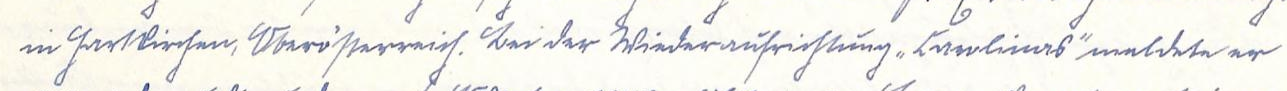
in Hartkirchen, Oberösterreich. Bei der Wiederaufrichtung „Carolinas" meldete er
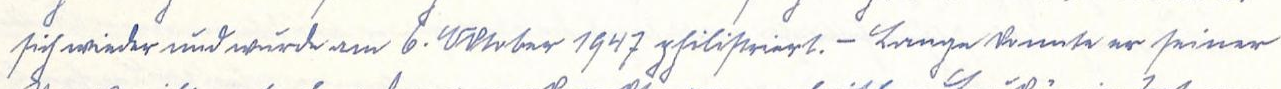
sich wieder und wurde am 6. Oktober 1947 philistriert. Lange konnte er seiner
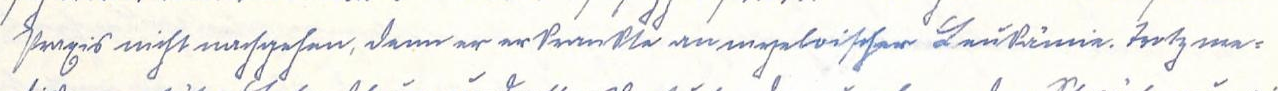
Praxis nicht nachgehen, denn er erkranke an myeloischer Leukämie. Trotz me-
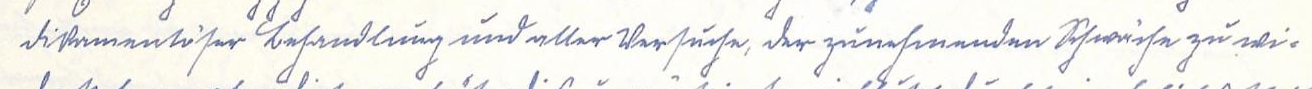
dikamentöser Behandlung und aller Versuche, der zunehmenden Schwäche zu wi-
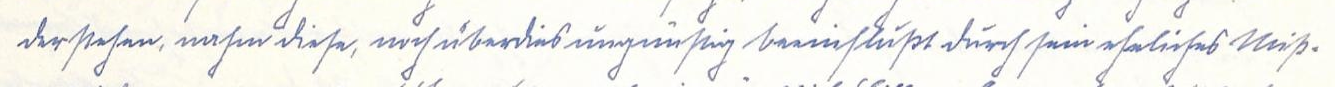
derstehen, nahm diese, noch überdies ungünstig durch sein eheliches Miß-
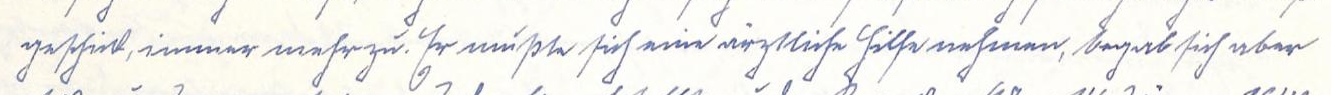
geschick, immer mehr zu. Er muste sich eine ärztliche Hilfe nehmen, begab sich aber
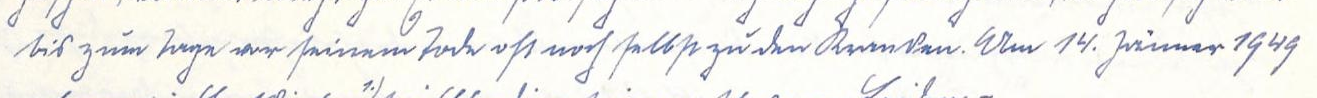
bis zum Tage vor seinem Tode oft noch selbst zu den Kranken. Am 14. Jänner 1949
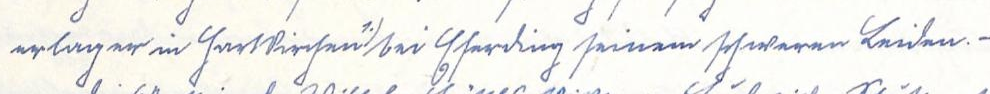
erlag er in Hartkirchen 1) bei Offerding seinem schweren Leiden.
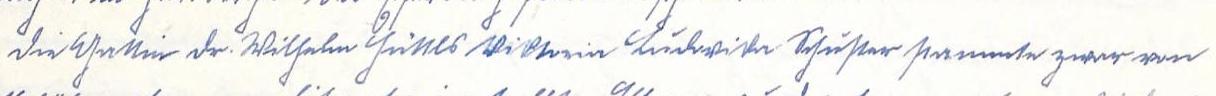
Die Gattin Dr. Wilhelm Hüttls Viktoria Ludovika Schuster stammte zwar von
